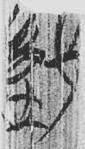○（愷）
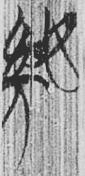○（豫）
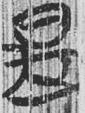是
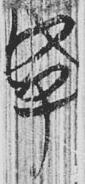好
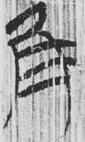隹（唯）
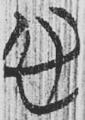心
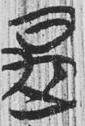是
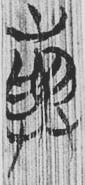藇
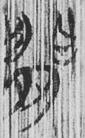○（間）
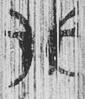○（關）
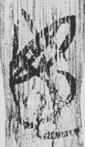○（謀）
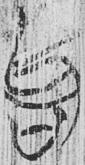司（治）
